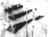三
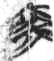赤
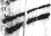二
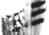三
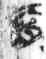首顔
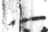一
